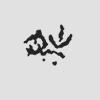遠
